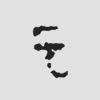亓（其）
